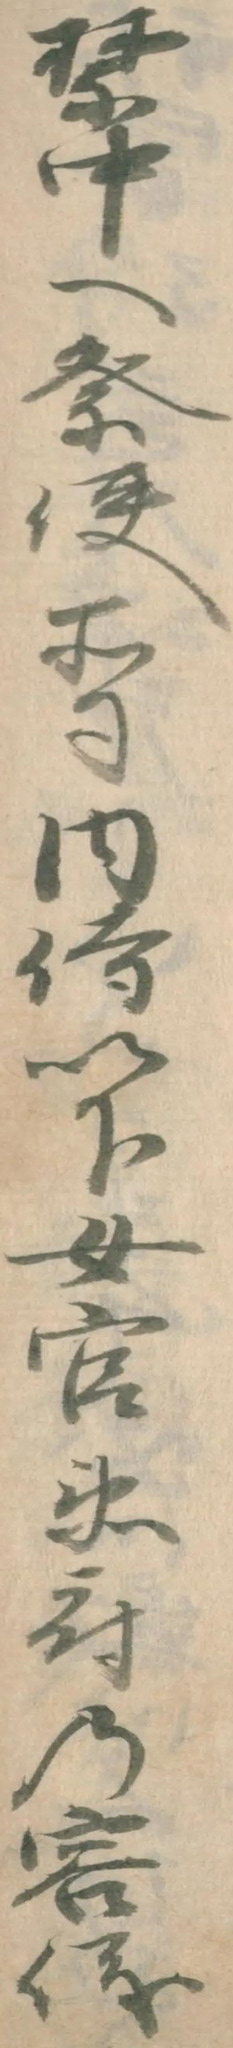禁中へ祭使所司内侍以下女宮衛府の容儀

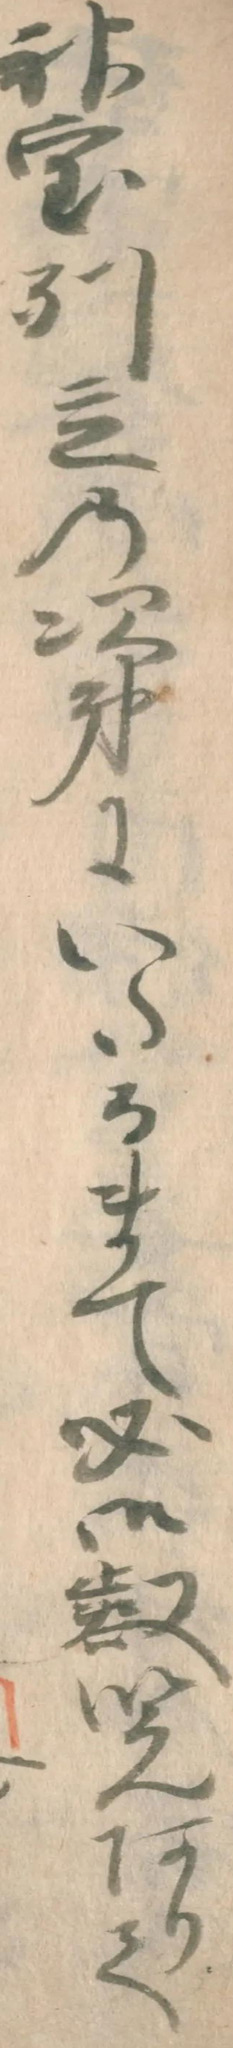神宝列立の次第にいたるまて必御叡覧ありて
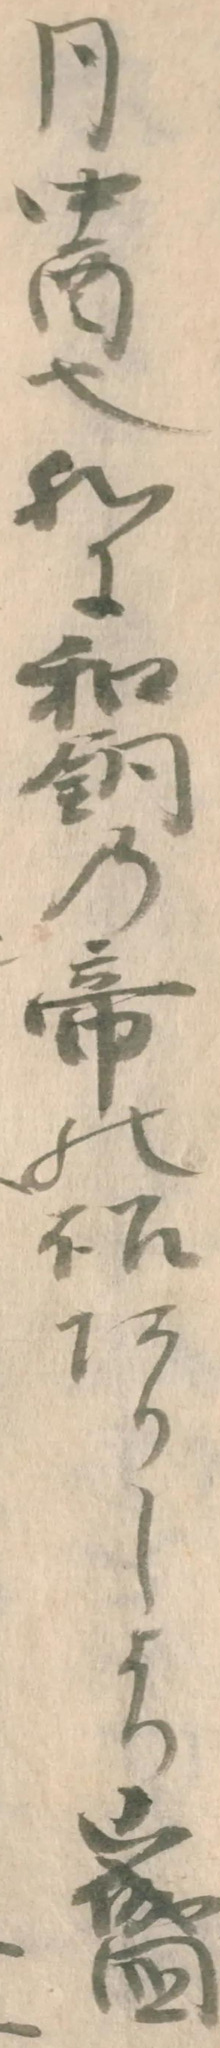月中酉也然に和銅の帝の詔ありしより山城国
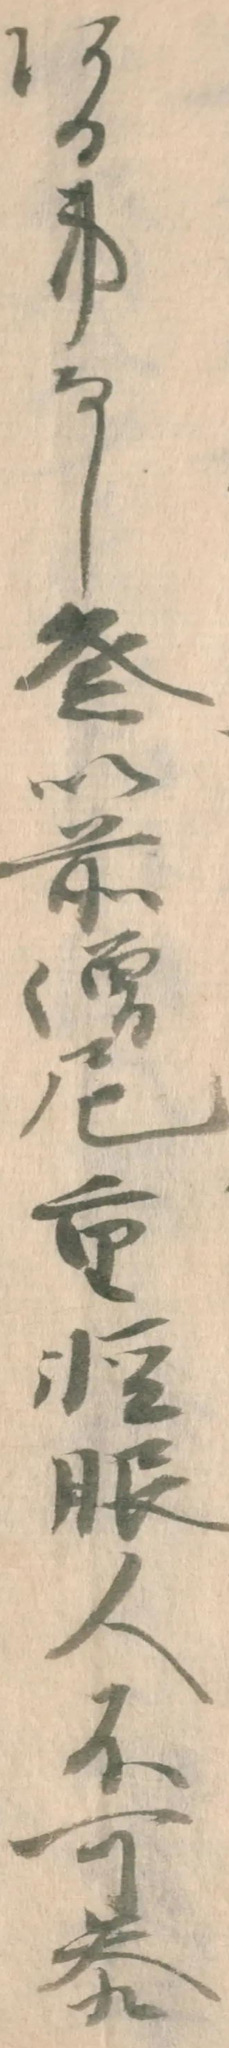ある事なし祭以前僧尼重軽服人不可参
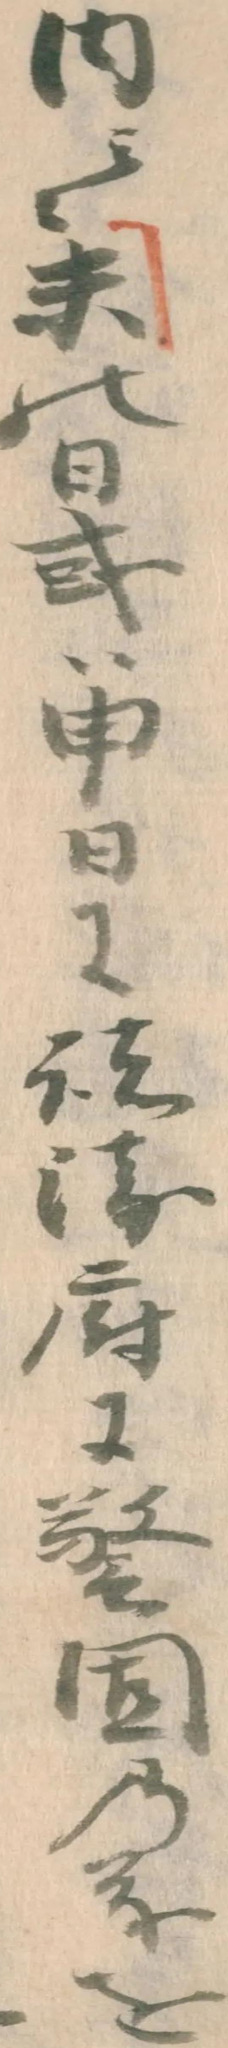内云々未の日或は申日に諸衛府に警固の義を
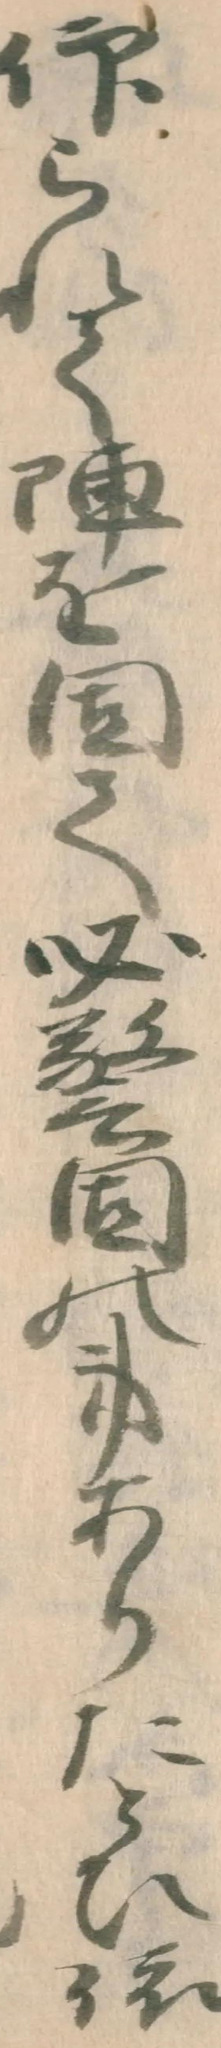仰られて陣を固て必警固の事ありたとひ依
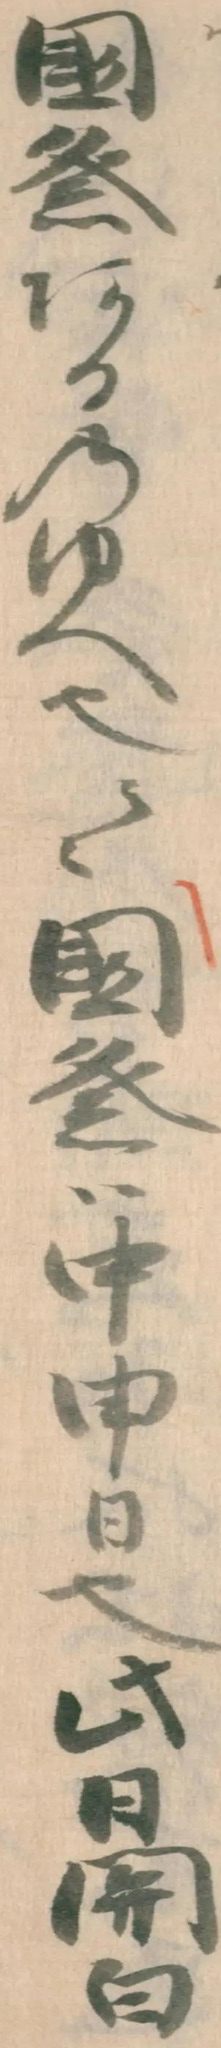国祭あるのゆへ也云々国祭は中申日也此日関白
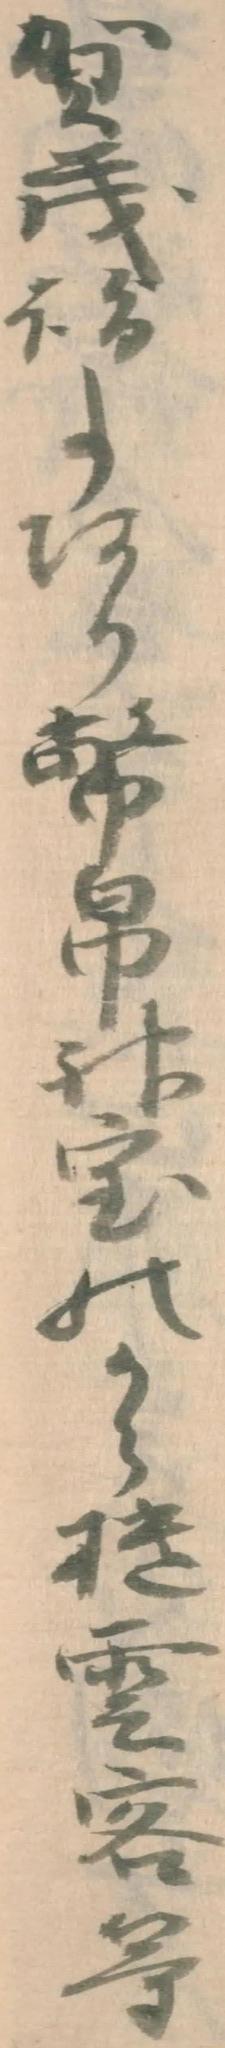賀茂詣事あり幣帛神宝のから樻雲客等
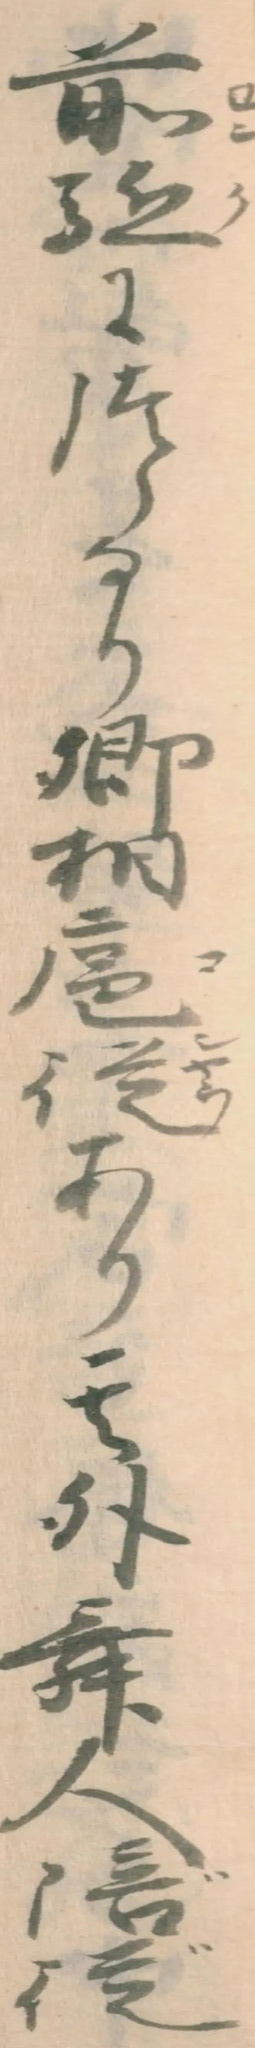前駈につらなり卿相扈従あり其外舞人陪従
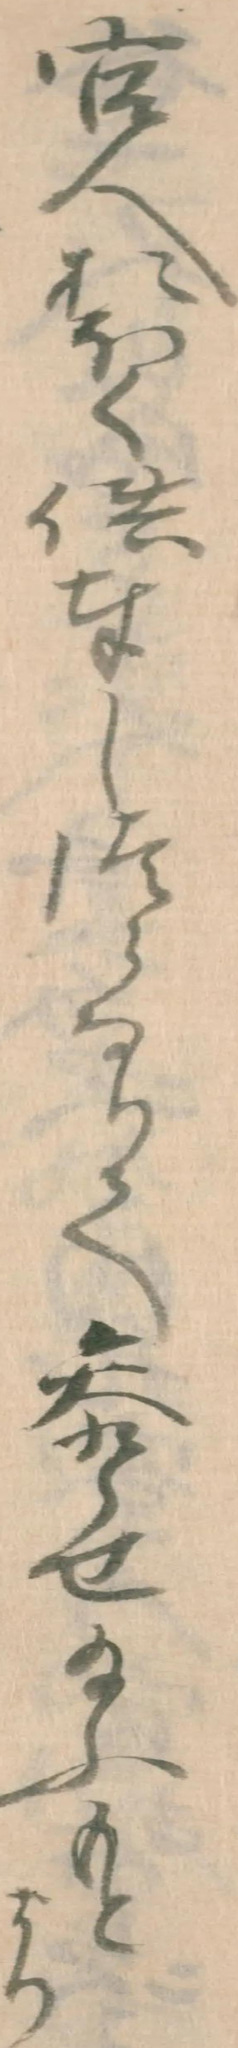官人おほく供奉しつらなりて参らせ給ふもとより
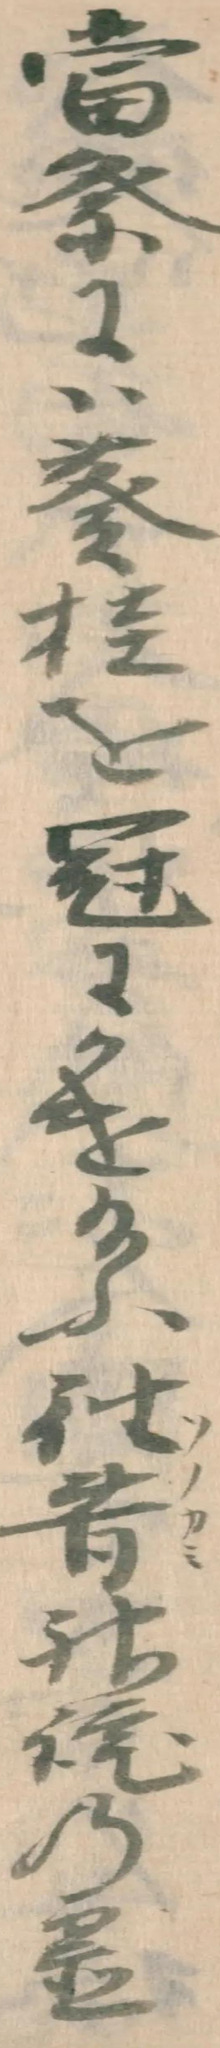當祭には葵桂を冠にかけ給ふ往昔神詫の霊
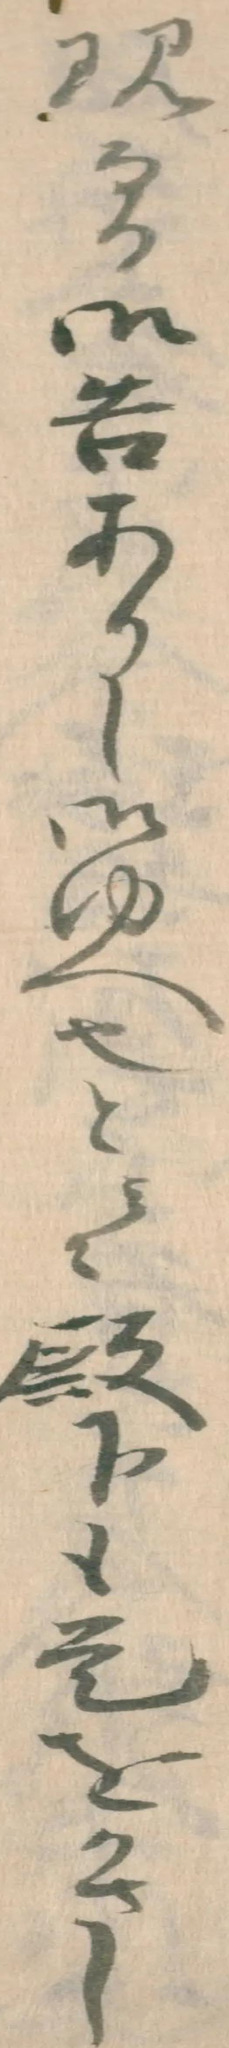現なる御告ありし御ゆへ也と云々殿下も是をかさし
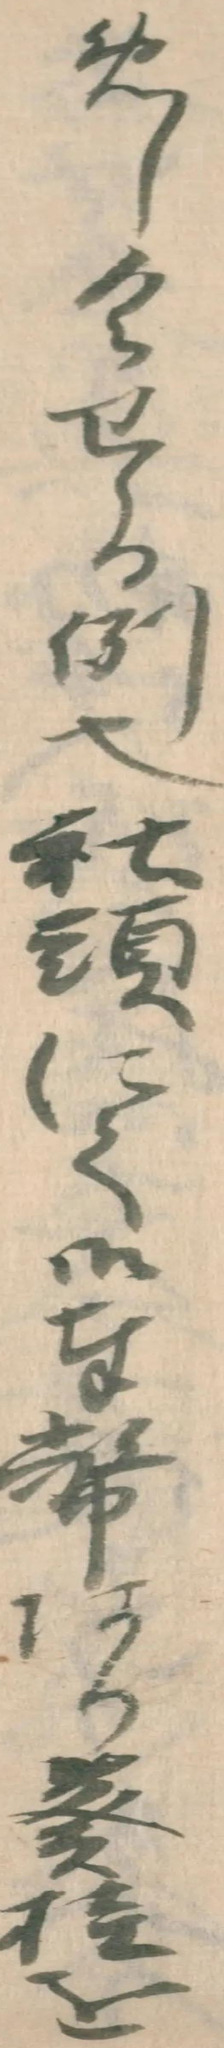めし具せらる例也社頭にて御奉幣あり葵桂を
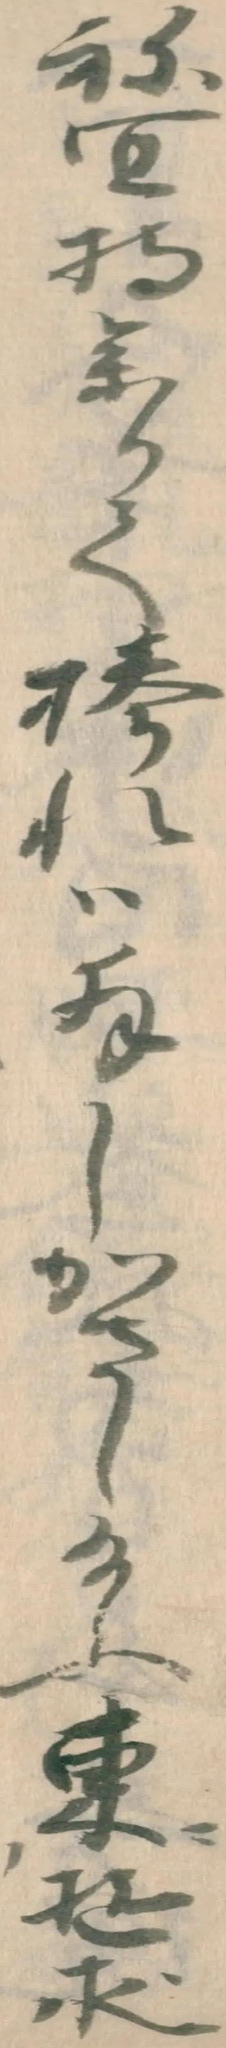祢宜持参りて捧れは拝しかさし給ふ東-遊求
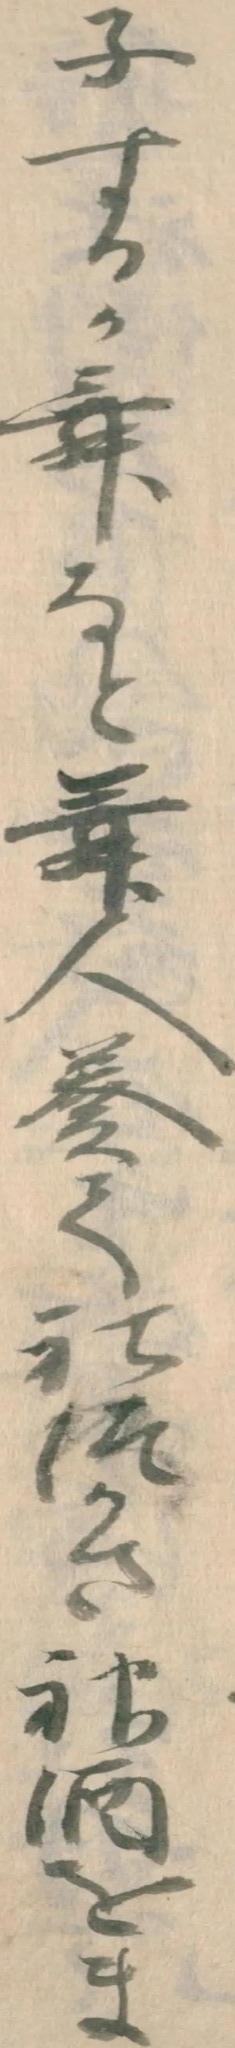子するか舞なと舞人奏て社つかさ神酒をま
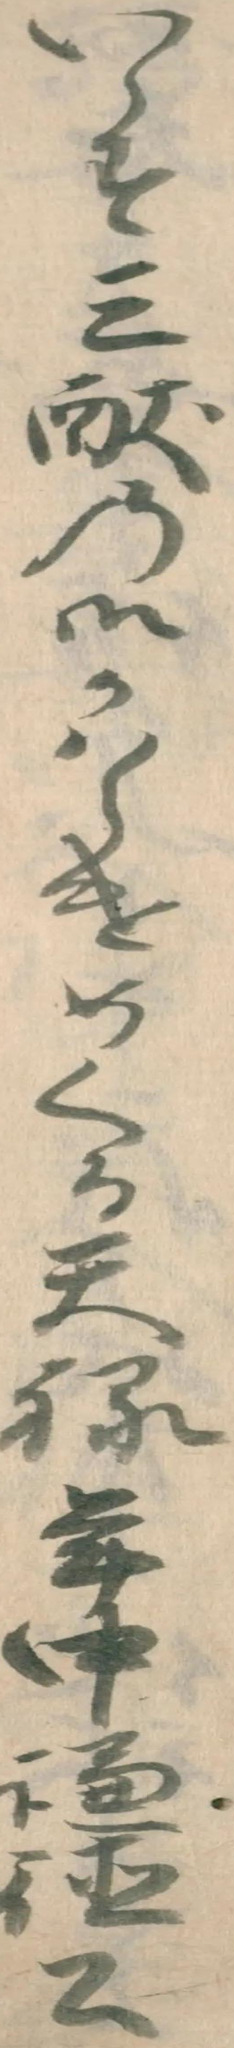いらす三献の御かはらけめくる天禄年中謙徳公
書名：賀茂社記録. 第1冊
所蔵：国立国会図書館 National Diet Library, JAPAN
